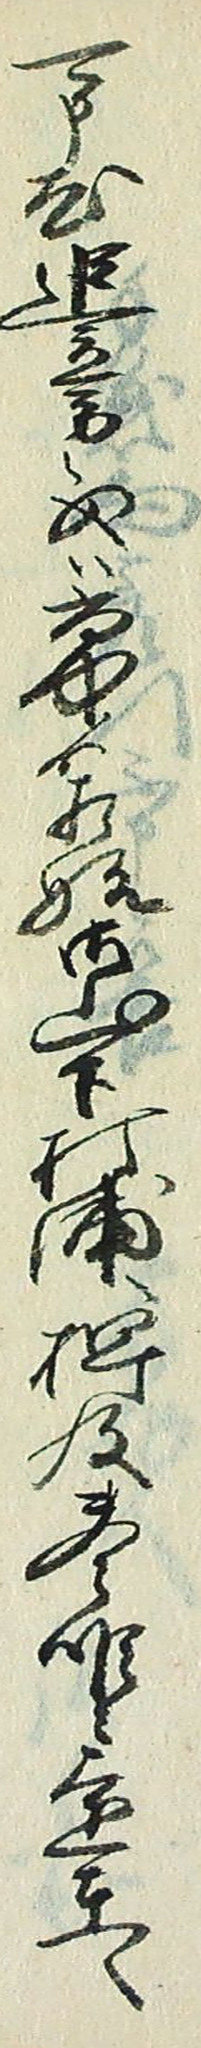可申尤追立方之義ハ市中ゟ相始御山下村浦へ押及夫々順ニ遠在へ
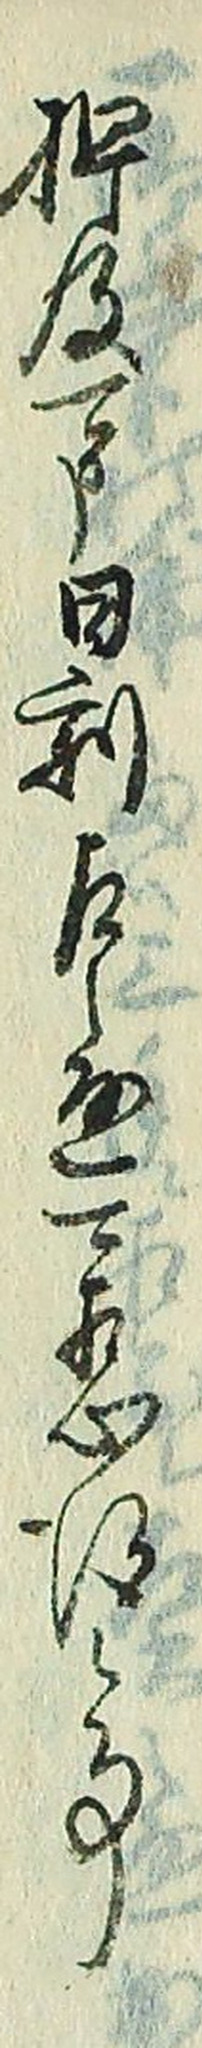押及可申日割左之通可相心得候事
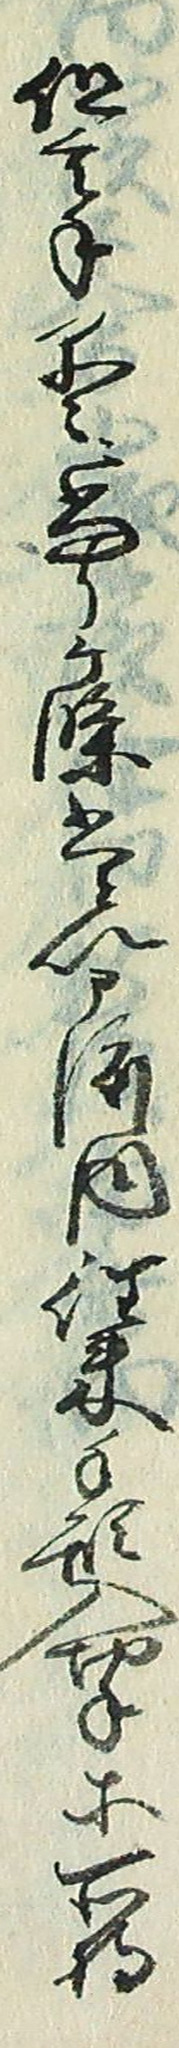但今年早々ニ當りケ條書ヲ以申渡候内往来手形入切手等所持
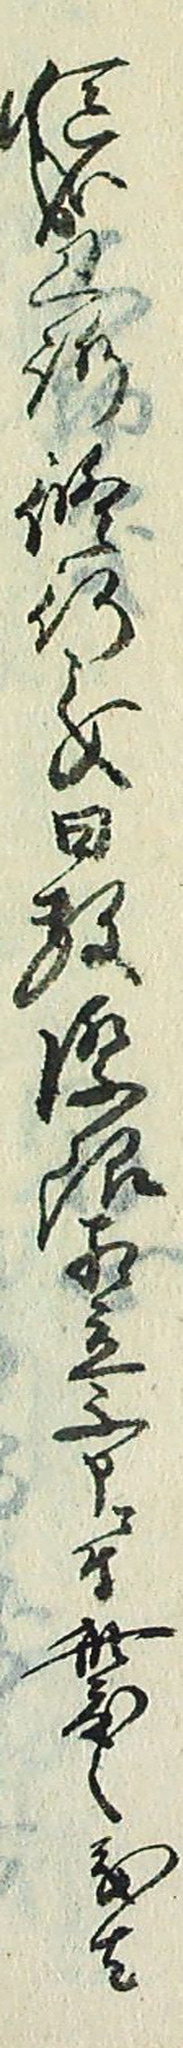慥成辺路修行之義日数際限相立不申ニ付此度之義者
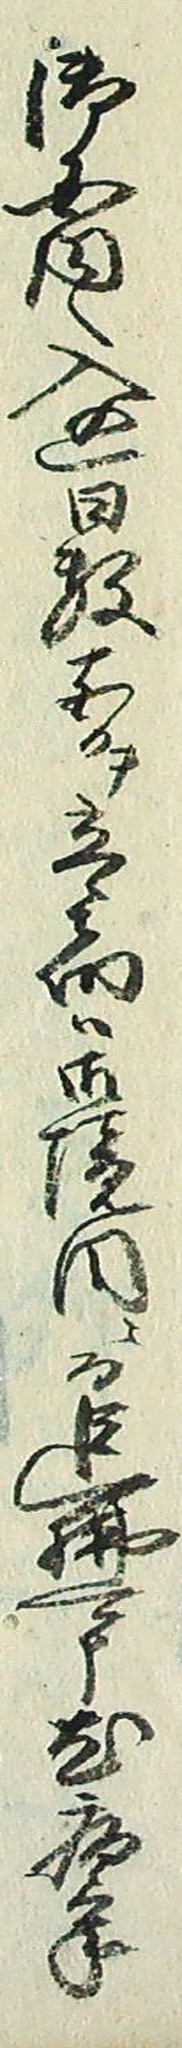御国内へ入込日数十五日ヲ立候者ハ御境目ニ而追拂可申尤病気
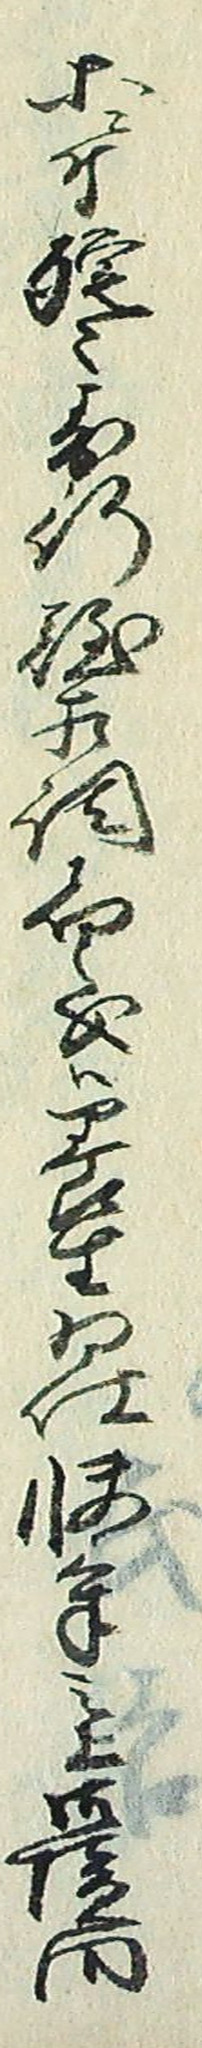等ニ付聢ニ歩行難相調者之義ハ養生為仕快気之上御境目
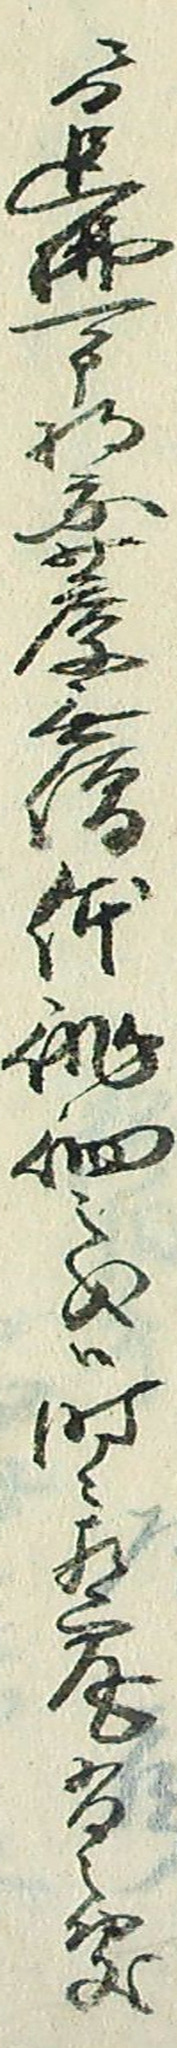ニ而追拂可申将亦薦無僧体徘徊之義ハ時々相究有之處
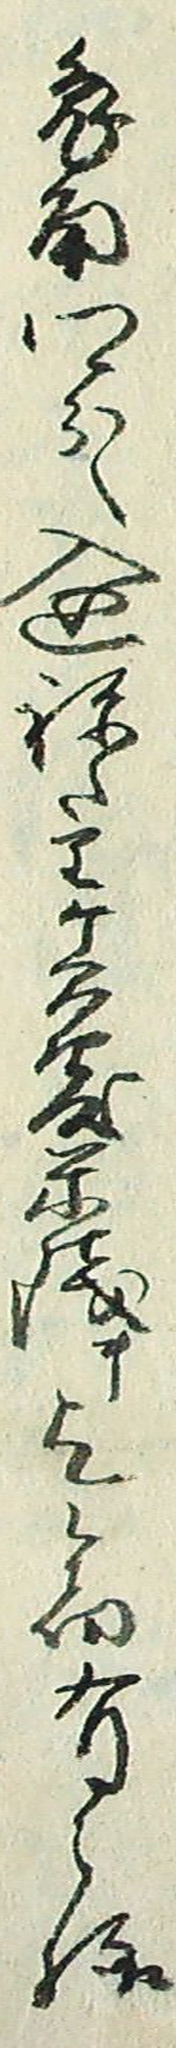兎角郷分へ入込ねたりケ間敷米銭ヲ乞候者有之趣

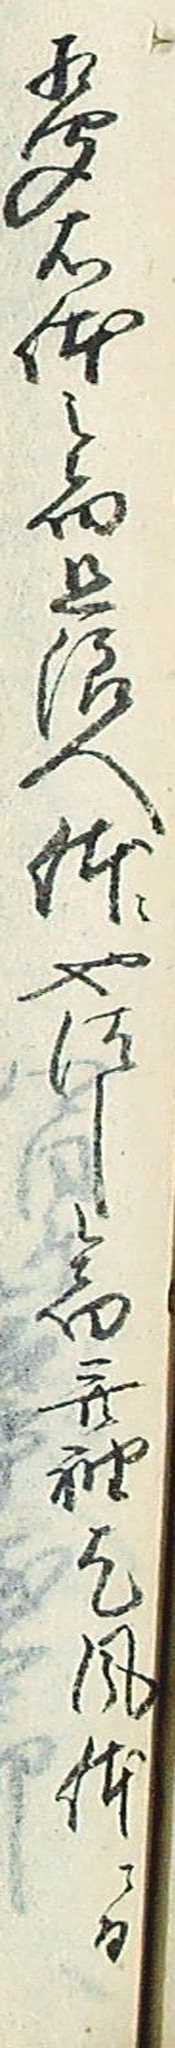相聞右体之者且浪人体ニやつし候者幷袖乞風体ニ而
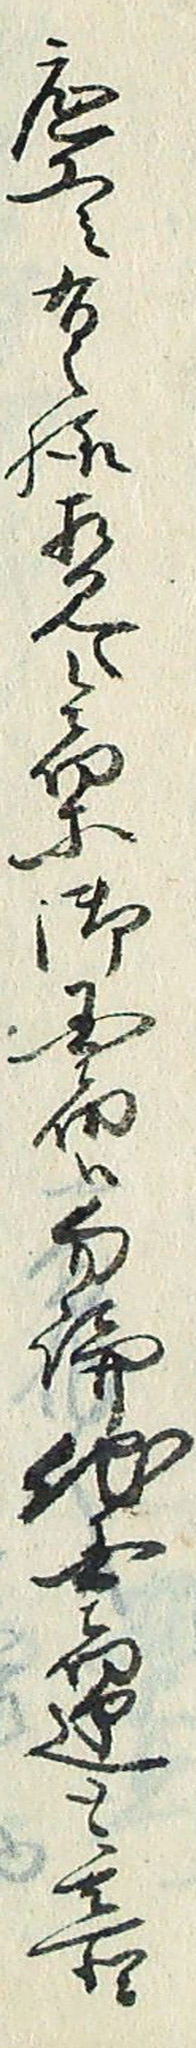底工ミ有之様相見候之者等御国者ハ勿論他国者迚も其所ニ
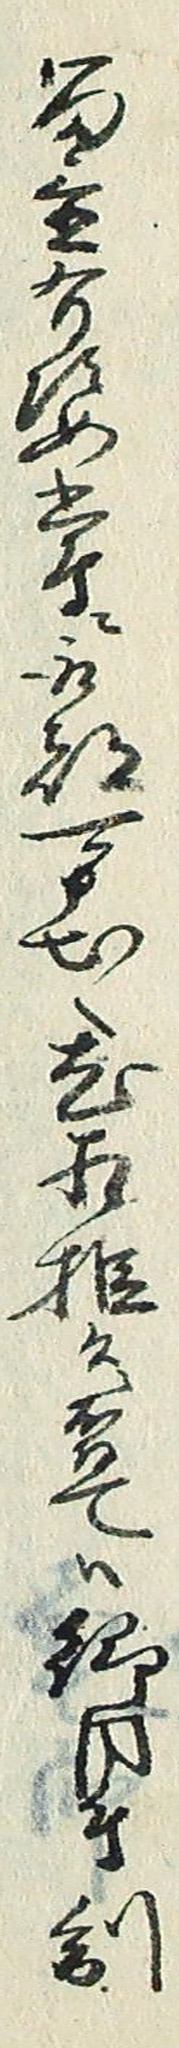留置有姿書付ニ取都可申出候尤相拒候ニおゐてハ郷目付制
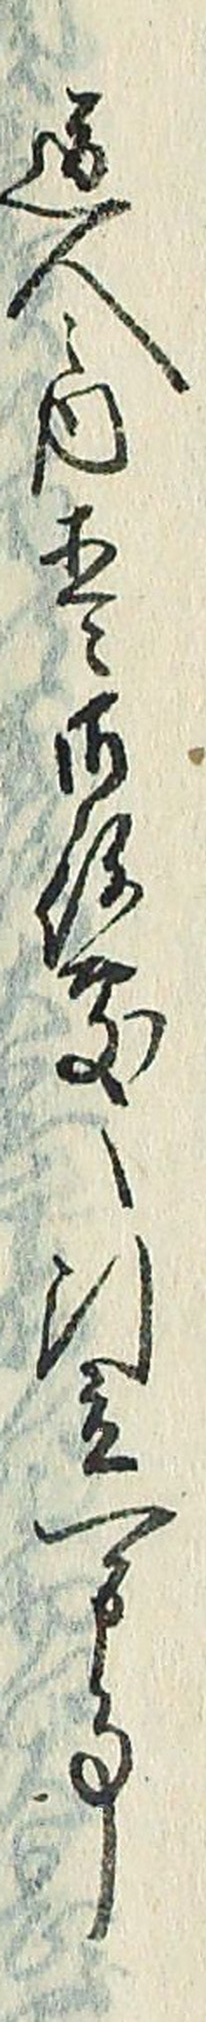道人之内直々御役處へ引立可申事
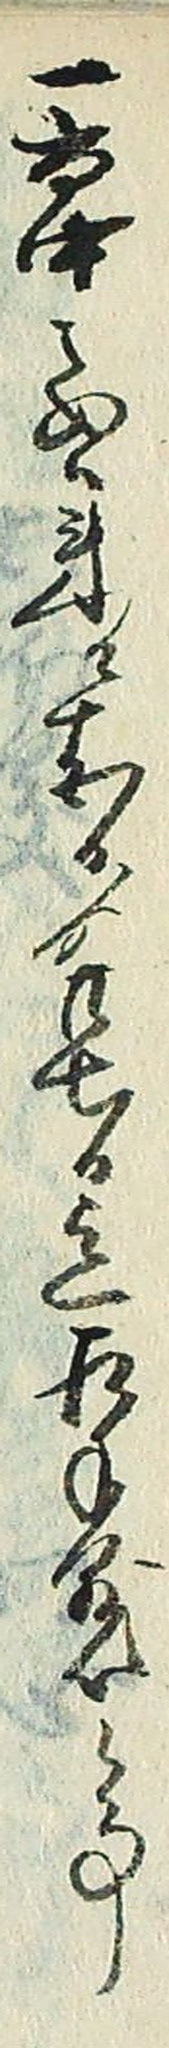一市中之義ハ来ル十五日ゟ廿七日迄相手懸候事
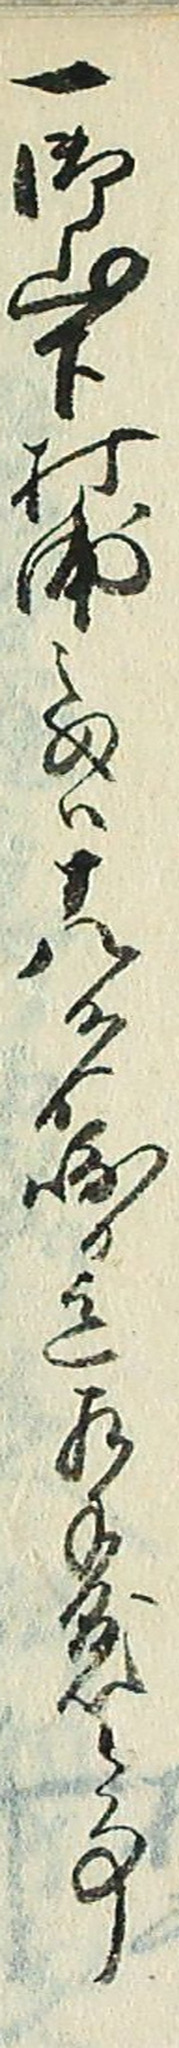一御山下村浦之義ハ十八日ゟ晦日迄相手懸候事
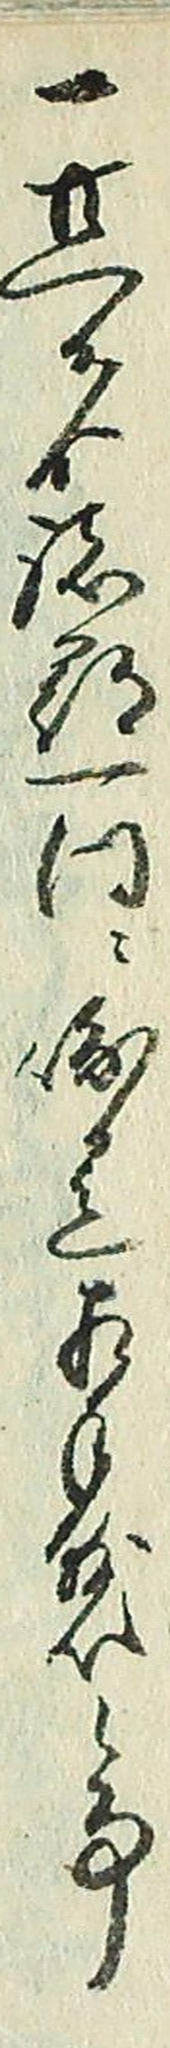一廿一日ゟ諸郡一同ニ晦日迄相手懸候事
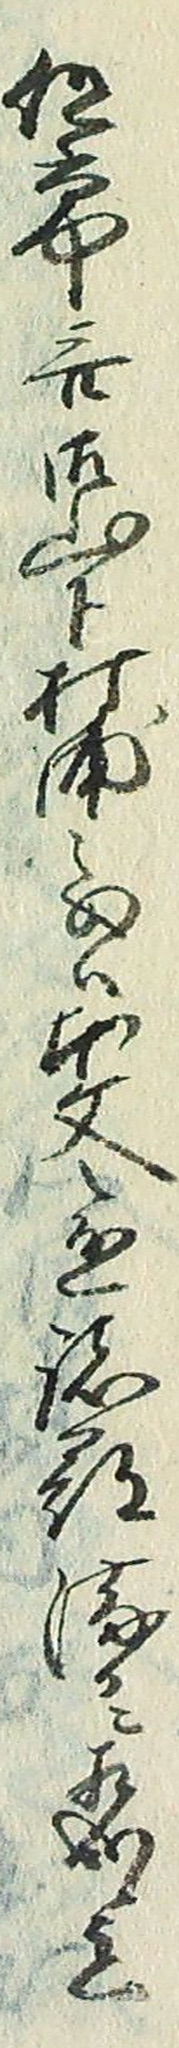但市中幷御山下村浦之義ハ本文之通諸郡満日ニ相成候迄
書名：諸御趣意書并御下知向之写
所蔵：鳴門教育大学 Naruto University of Education
